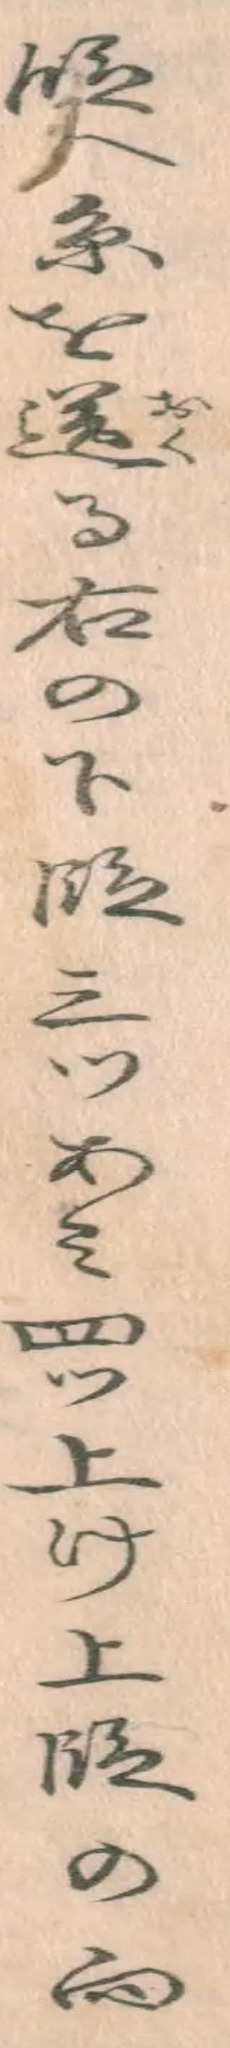段へ糸を送る右の下段三ッあみ四ッ上け上段の向
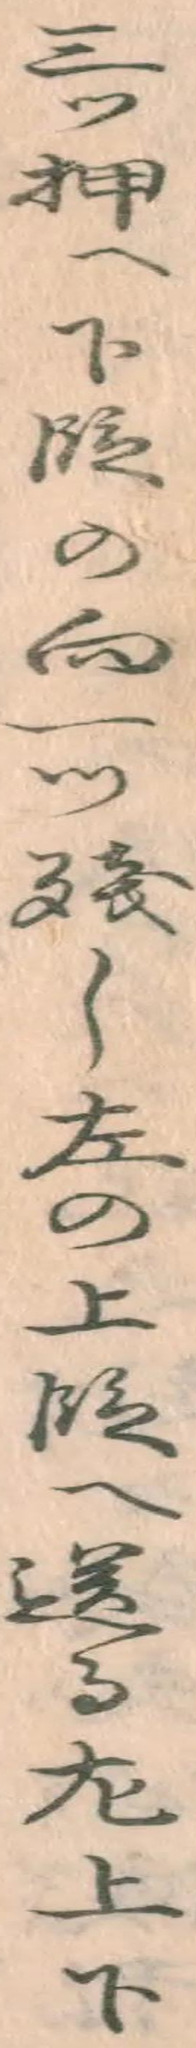三ッ押へ下段の向一ッ残し左の上段へ送る左上下
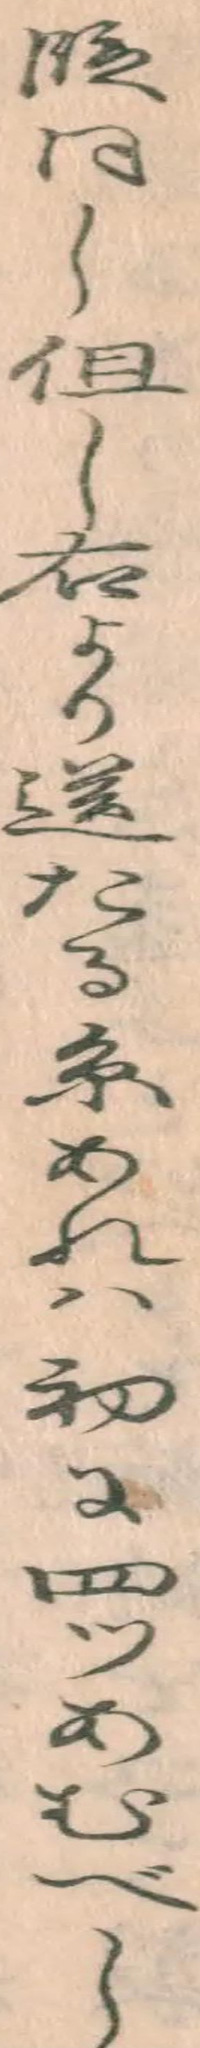段同し但し右より送たる糸あれは初に四ッあむべし
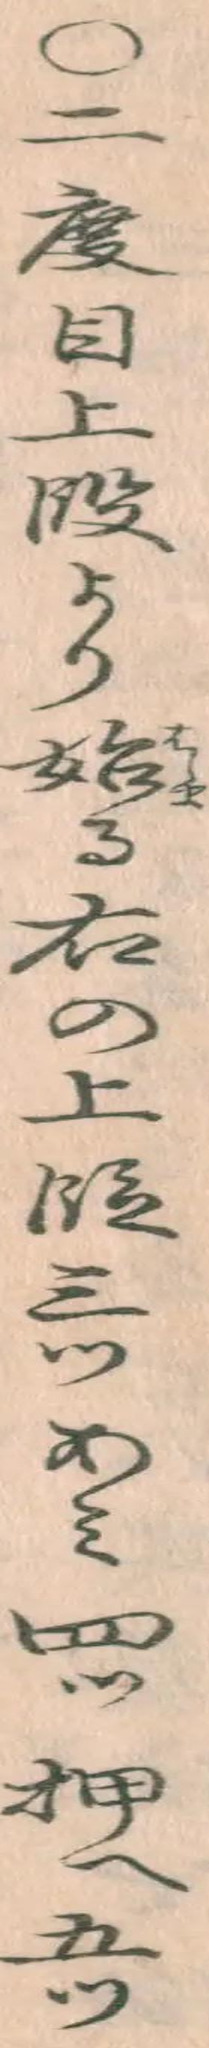○二度目上段より始る右の上段三ッあみ四ッ押へ五ッ
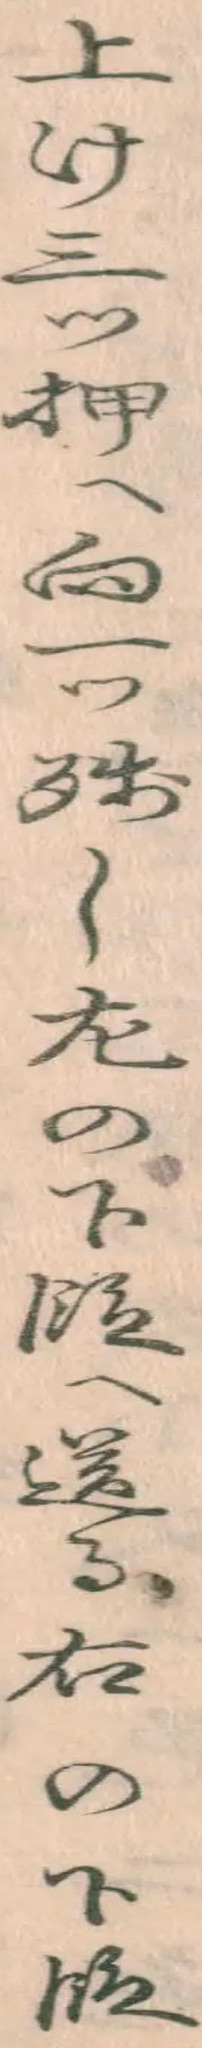上け三ッ押へ向一ッ残し左の下段へ送る右の下段
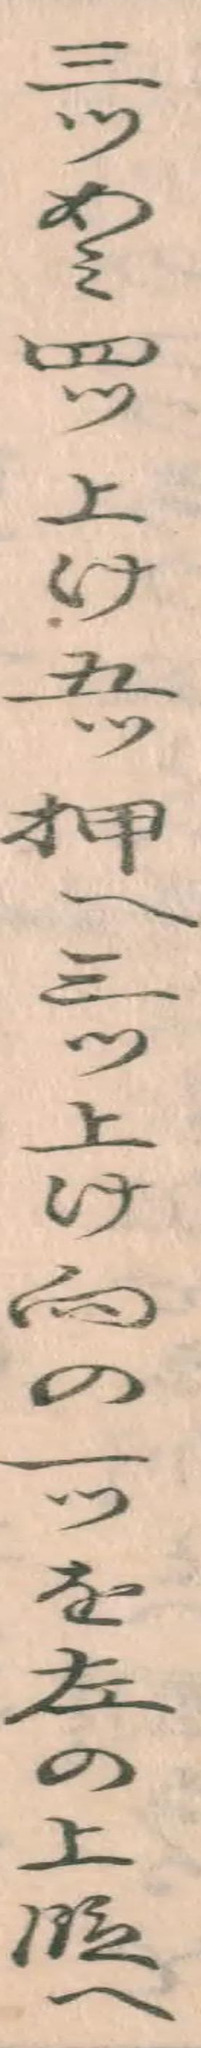三ッあみ四ッ上け五ッ押へ三ッ上け向の一ッを左の上段へ
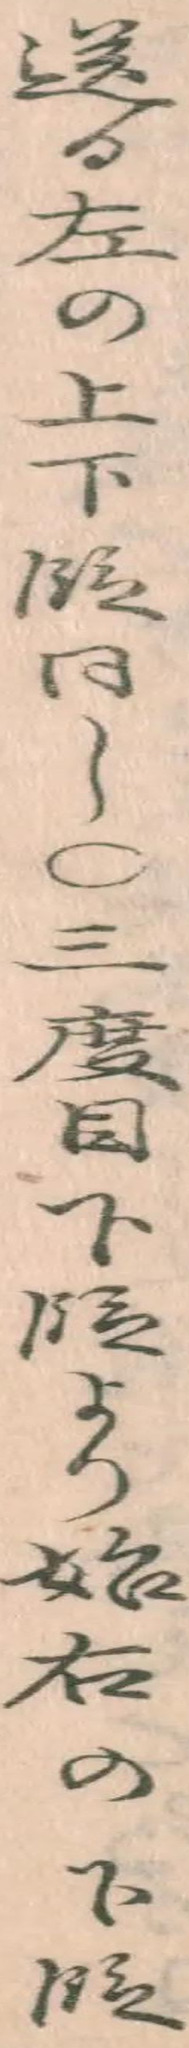送る左の上下段同し○三度目下段より始右の下段
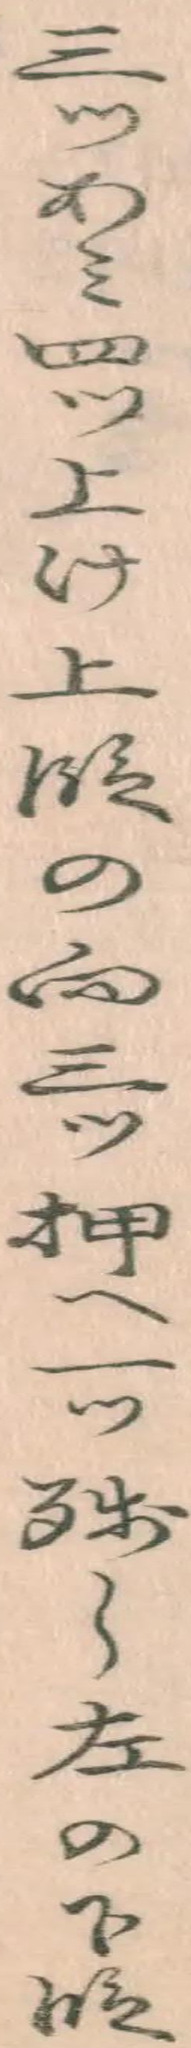三ッあみ四ッ上け上段の向三ッ押へ一ッ残し左の下段
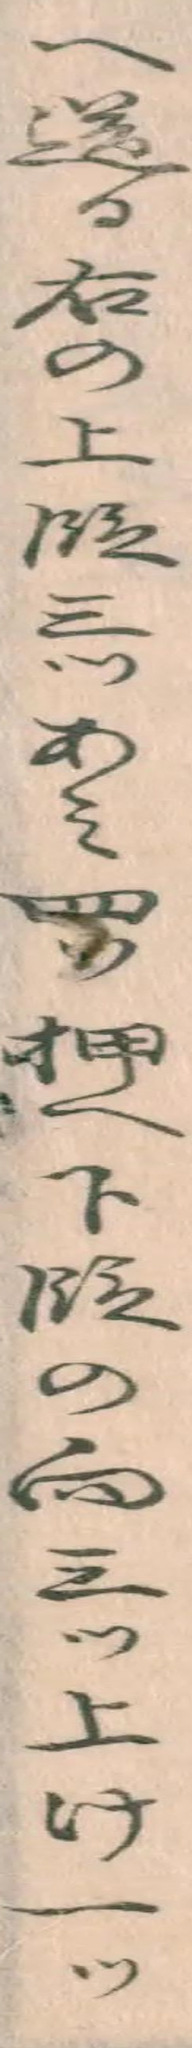へ送る右の上段三ッあみ四ッ押へ下段の向三ッ上け一ッ
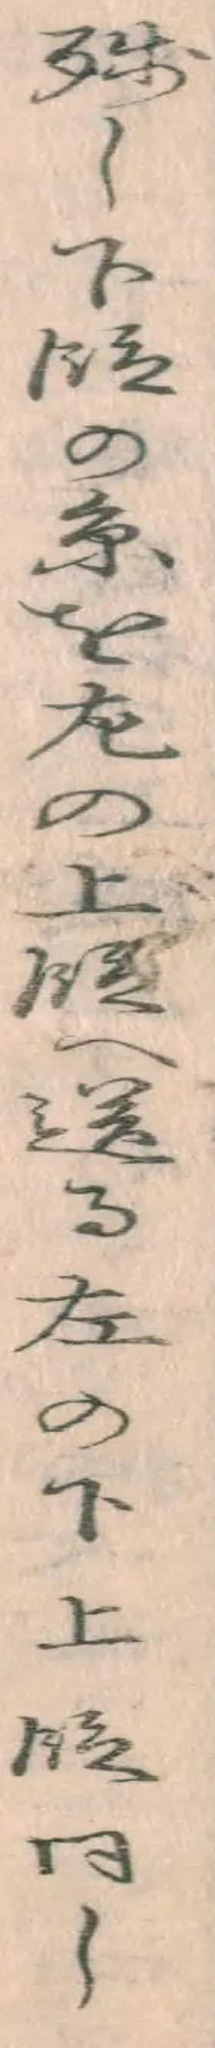残し下段の糸を左の上段へ送る左の下上段同し
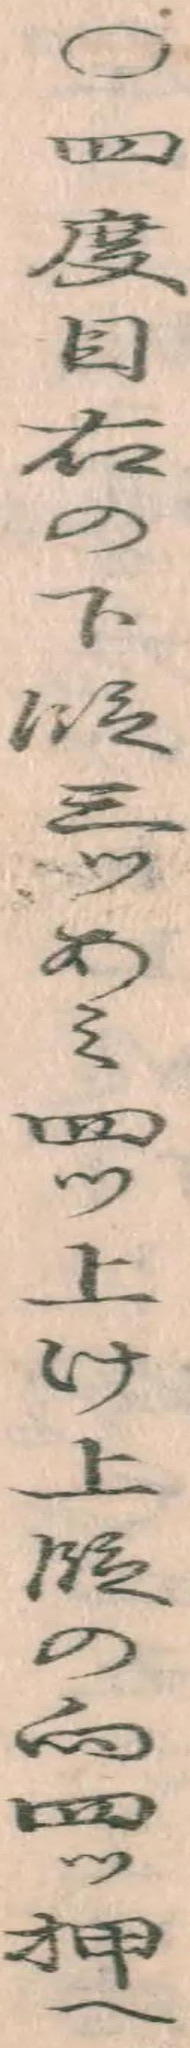○四度目右の下段三ッあみ四ッ上け上段の向四ッ押へ
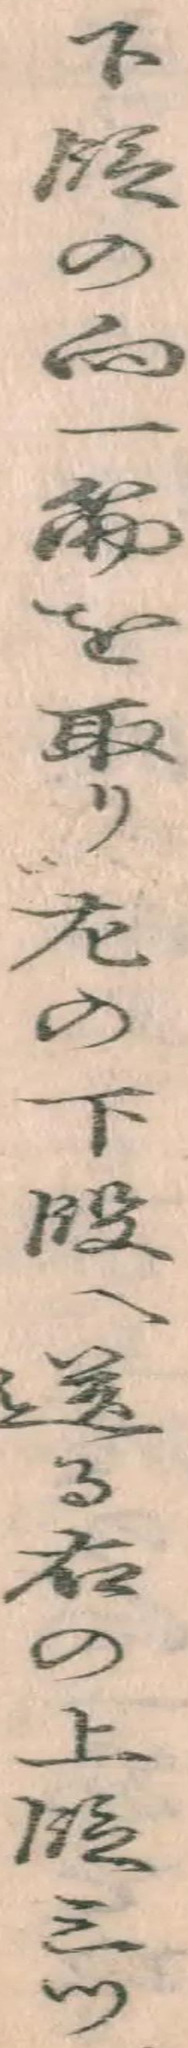下段の向一筋を取り左の下段へ送る右の上段三ッ
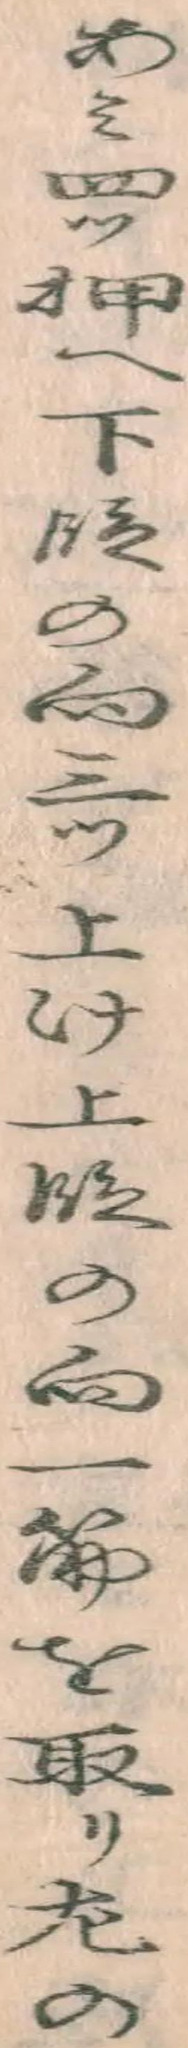あみ四ッ押へ下段の向三ッ上け上段の向一筋を取り左の
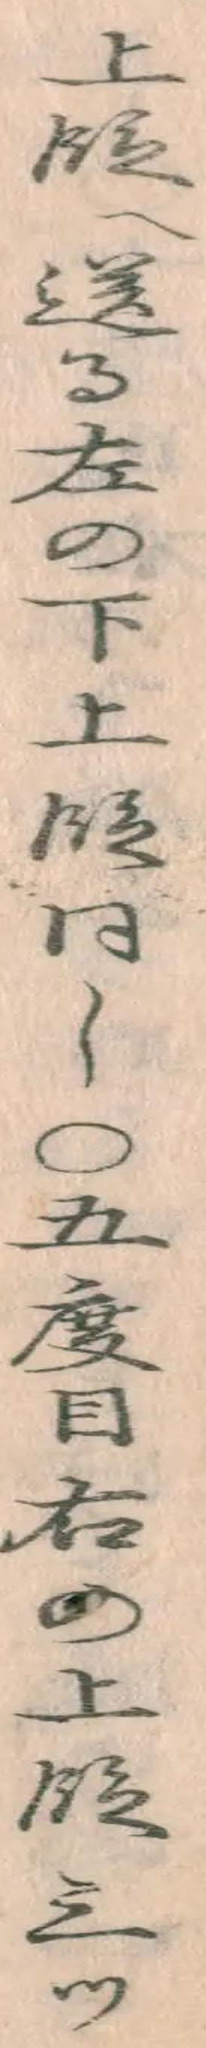上段へ送る左の下上段同し○五度目右の上段三ッ
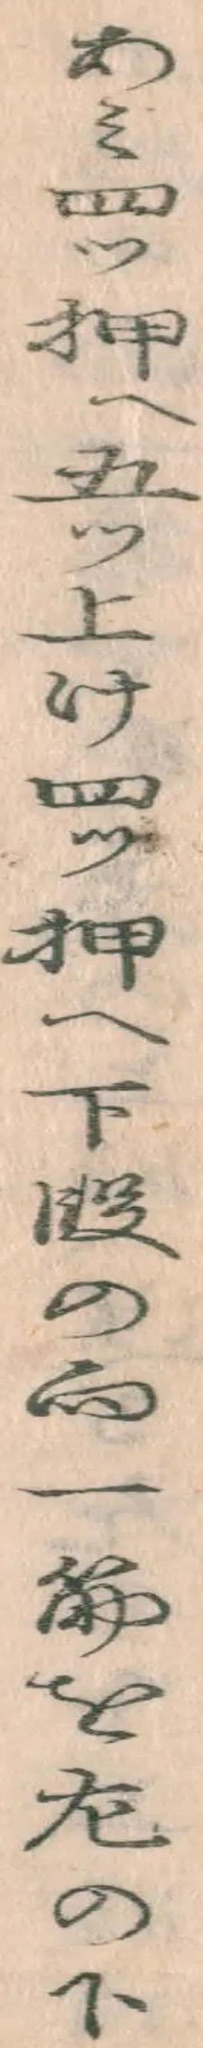あみ四ッ押へ五ッ上け四ッ押へ下段の向一筋を左の下
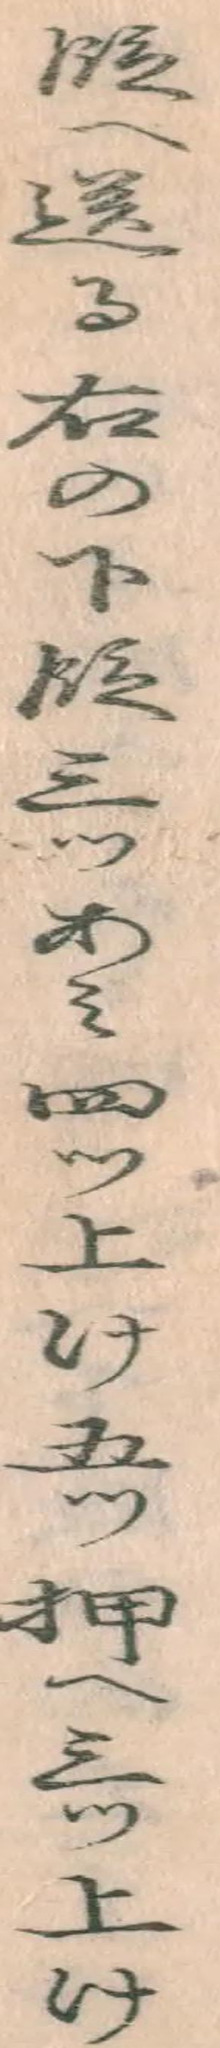段へ送る右の下段三ッあみ四ッ上け五ッ押へ三ッ上け
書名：機織彙編 5巻. [2]
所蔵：国立国会図書館 National Diet Library, JAPAN
